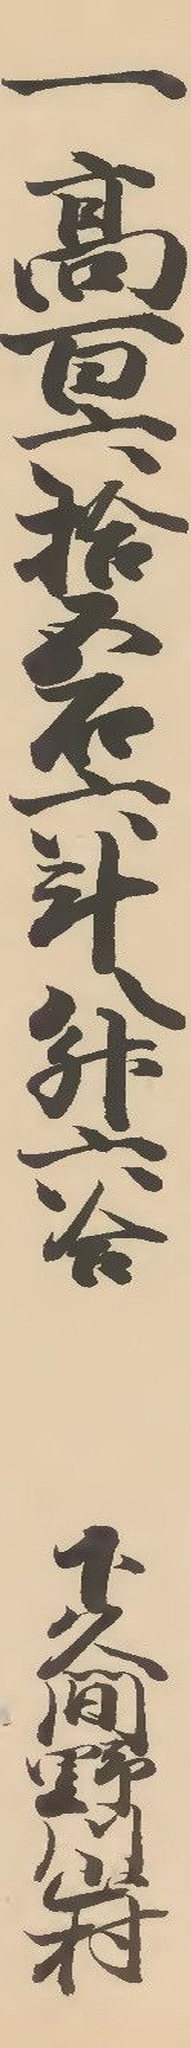一髙百六拾五石六斗八升六合下久間野川山村
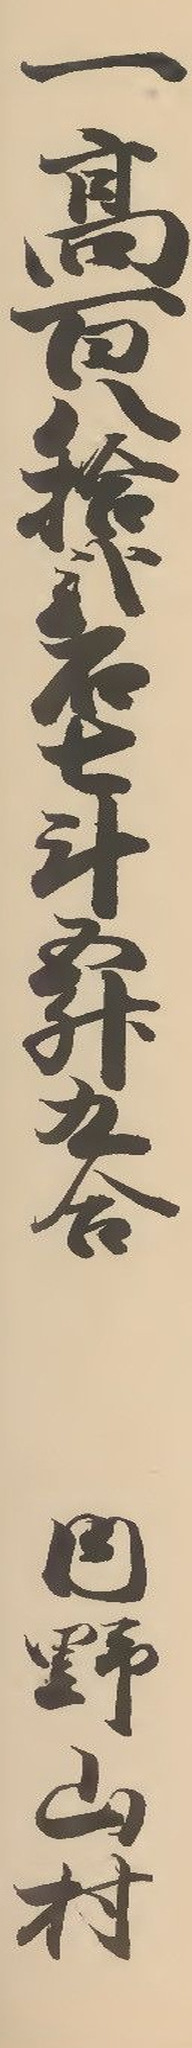一髙百八拾弐石七斗五升九合内野山村
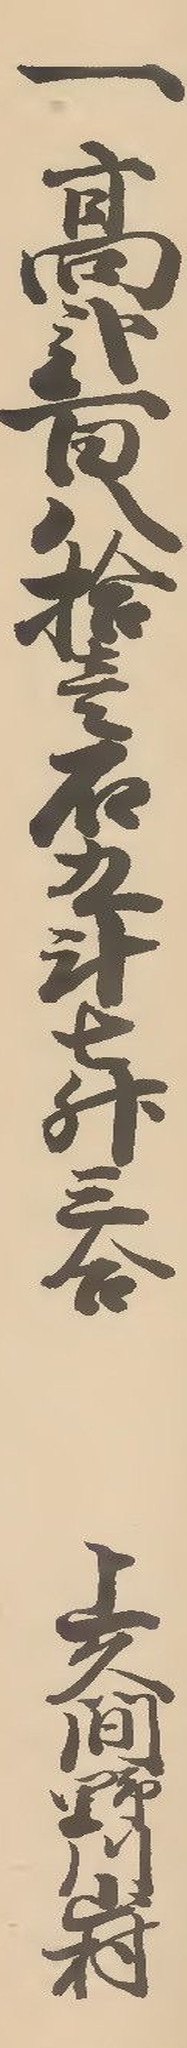一髙弐百八拾壱石九斗七升三上久間野川山村
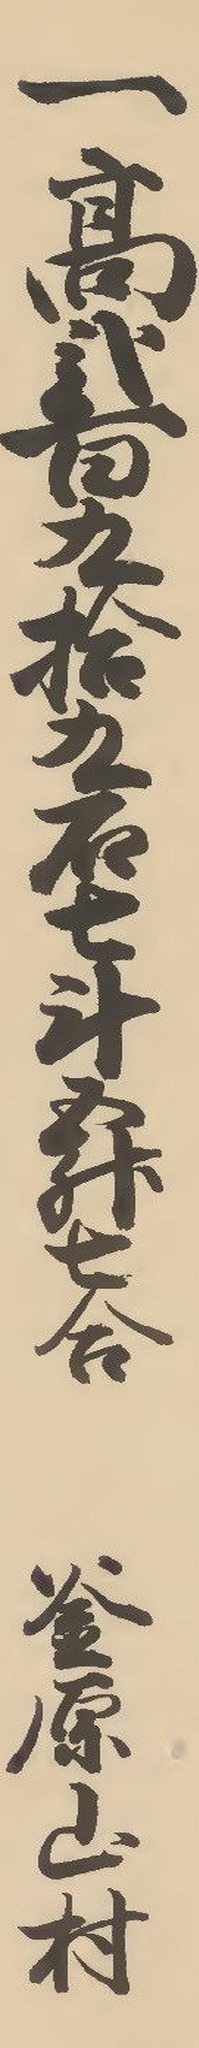一髙弐百九拾九石七斗五升七合釜原山村
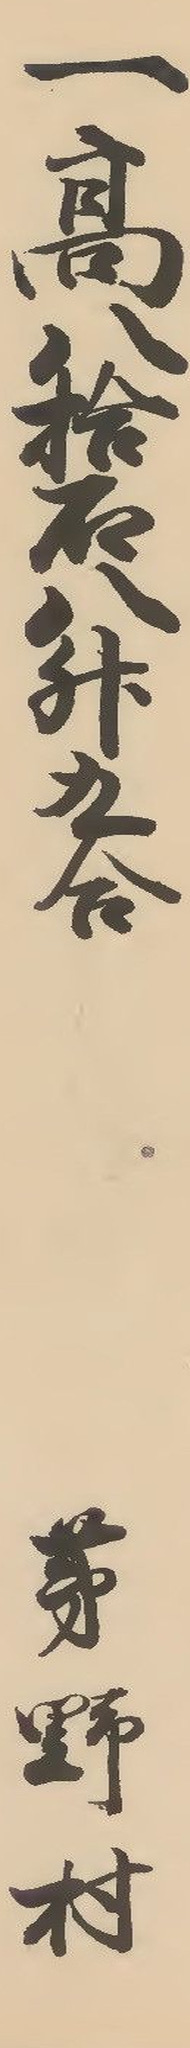一髙八拾石八升九合茅野村
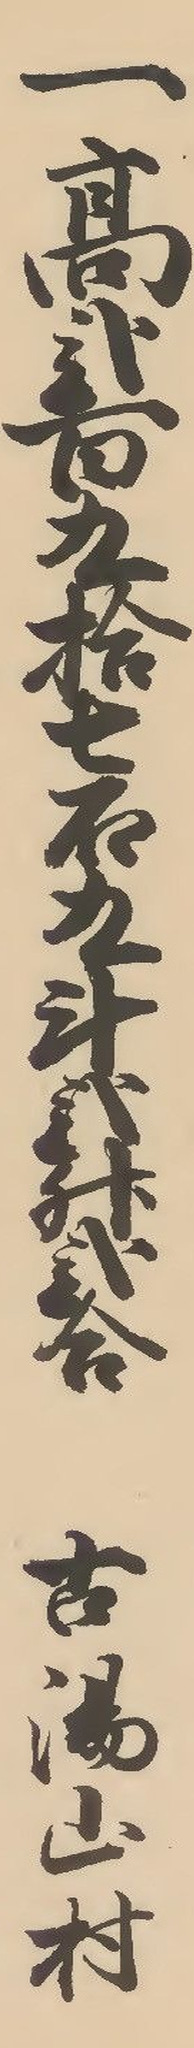一髙弐百九拾七石九斗弐升弐合古湯山村

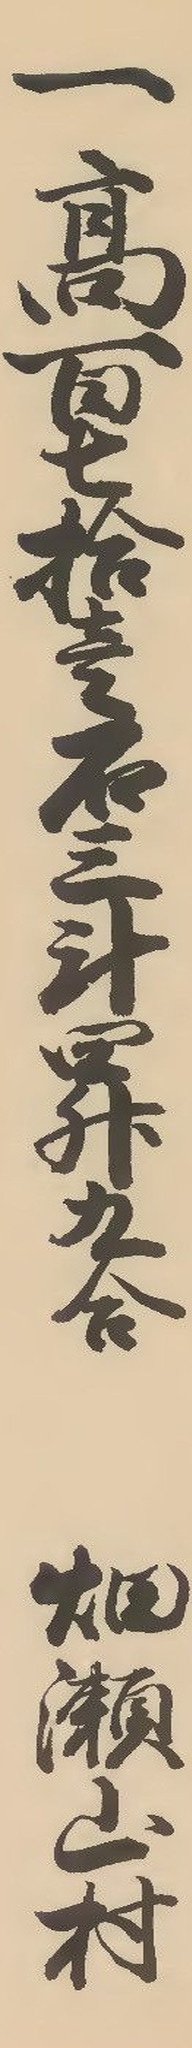一髙百七拾壱石三斗四升九合畑瀬山村
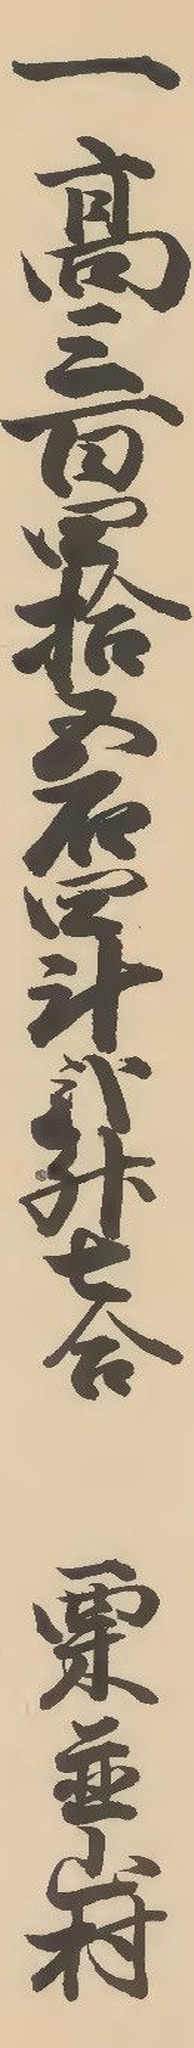一髙三百四拾五石四斗弐升七合栗並山村
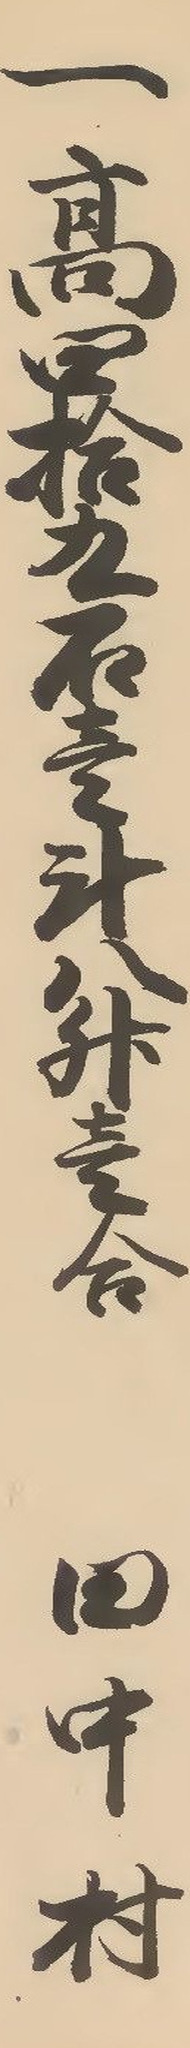一髙四拾九石壱斗八升壱合田中村
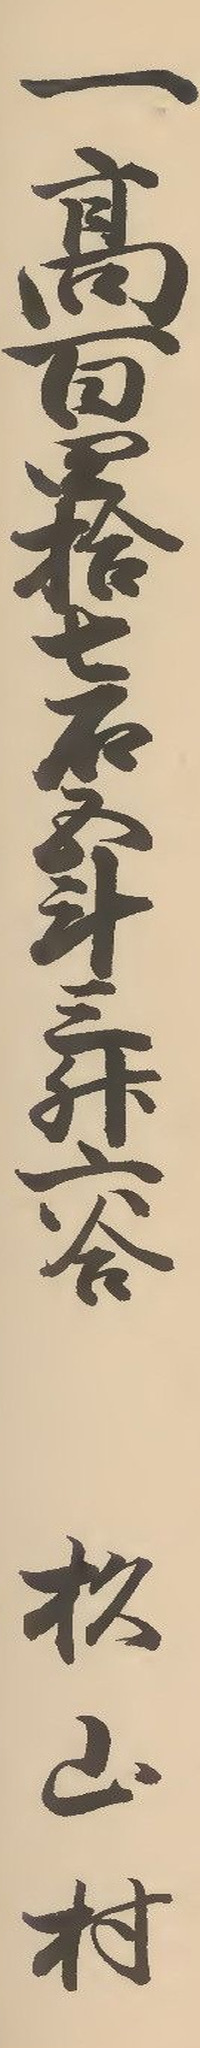一髙百四拾七石五斗三升六合杉山村
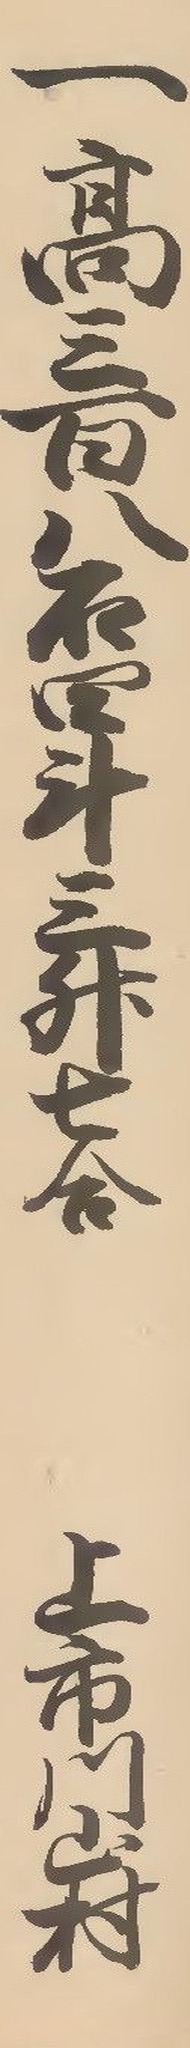一髙三百八石四斗三升七合上市川山村
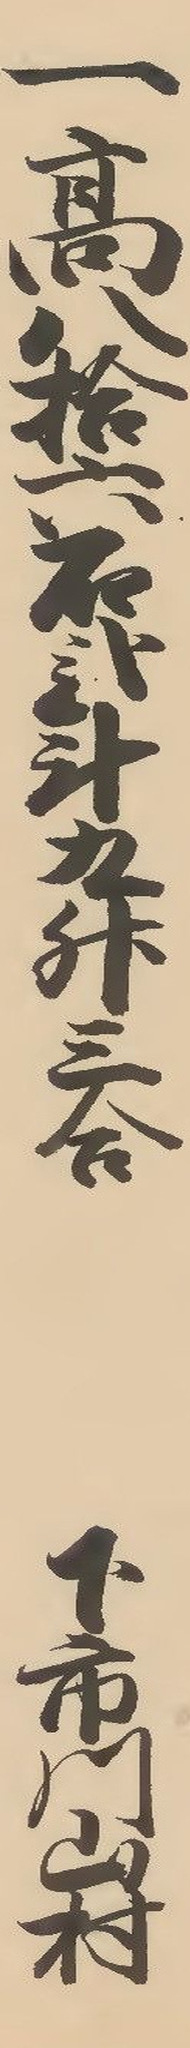一髙八拾六石弐斗九升三合下市川山村
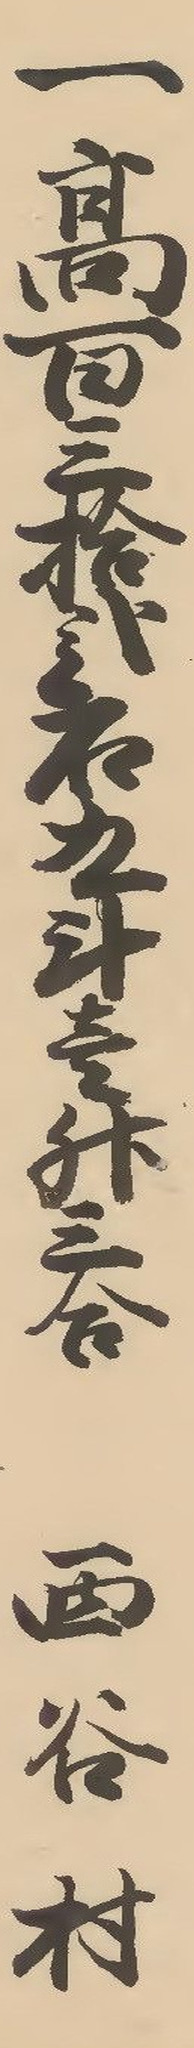一髙百三拾弐石九斗壱升三合西谷村
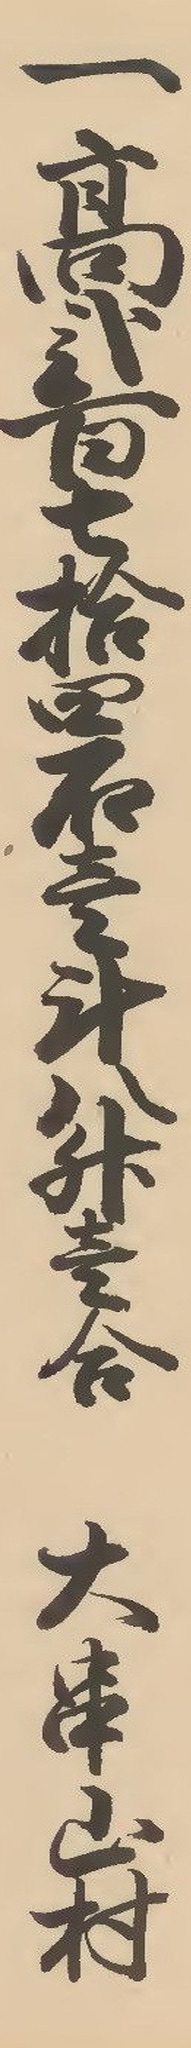一髙弐百七拾四石壱斗八升壱合大串山村

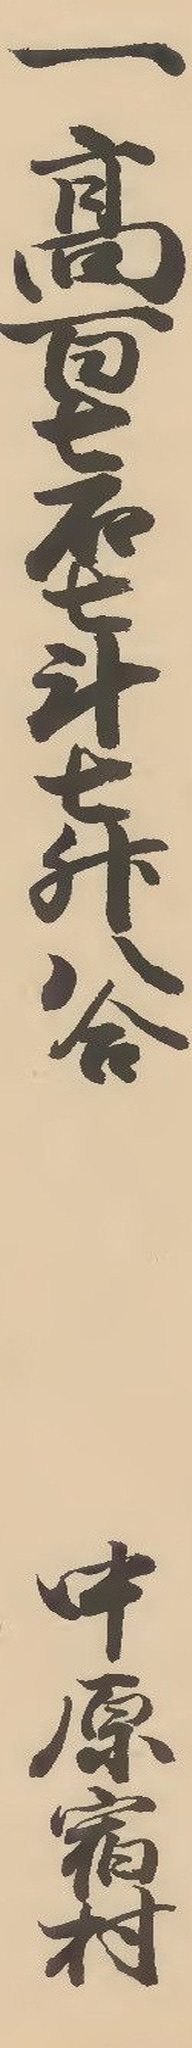一髙百七石七斗七升八合中原宿村
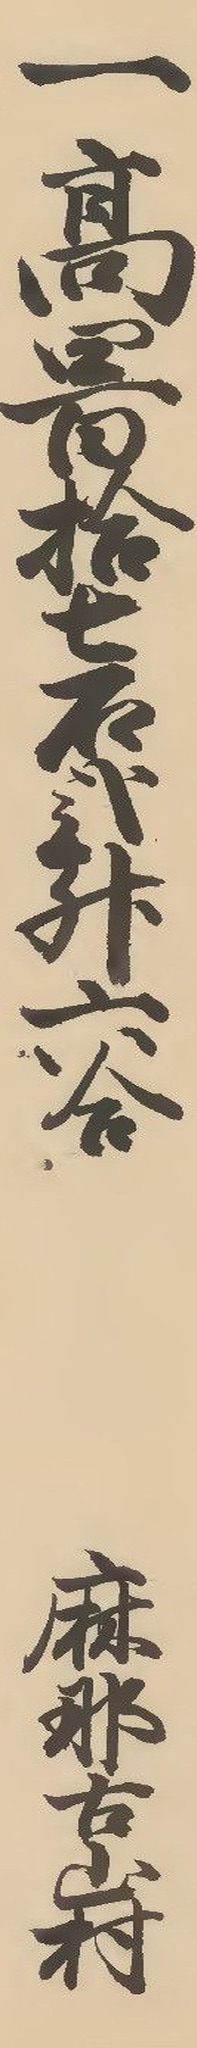一髙四百拾七石弐升六合麻那古山村
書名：肥前国郷帳
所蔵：国立公文書館 National Archives of Japan
